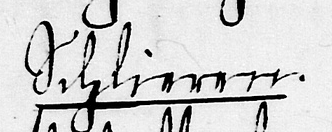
Schlieren.
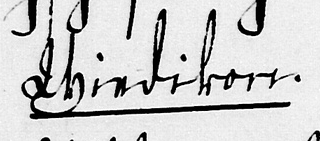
Wiedikon.
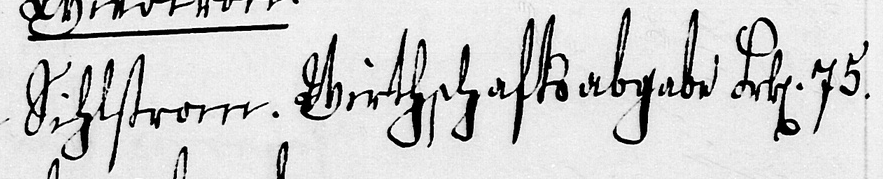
Sihlstrom. Wirthschaftsabgabe Frk[en].
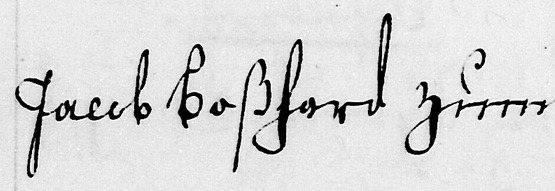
Jacob Boßhard zum
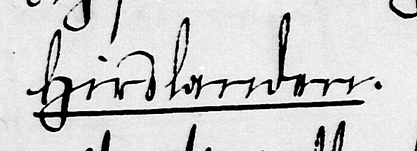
Hirslanden.
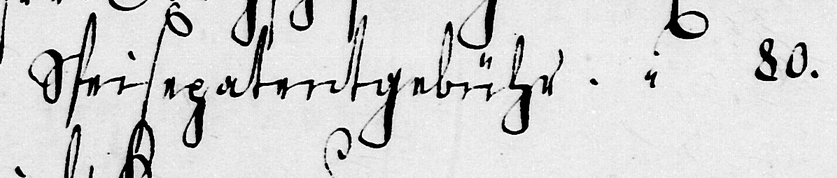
Speisepatentgebühr “ 80.
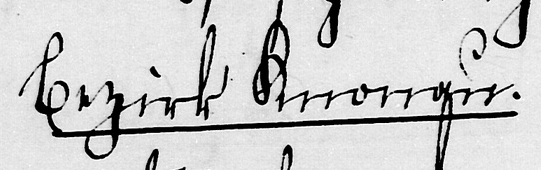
Bezirk Knonau.
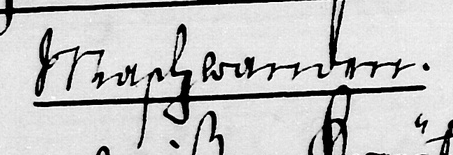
Maschwanden.
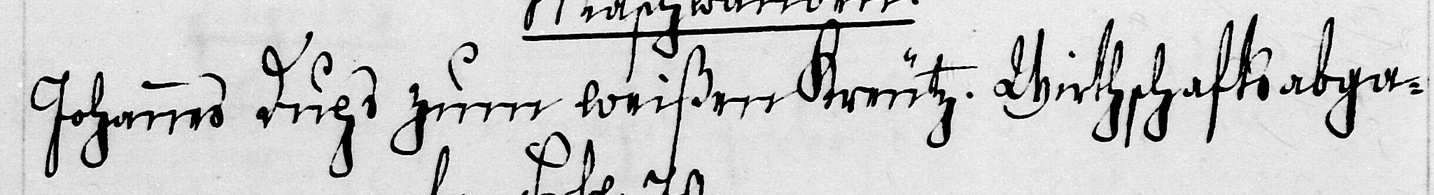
Johannes Dups zum weißen Kreutz. Wirthschaftsabga¬
